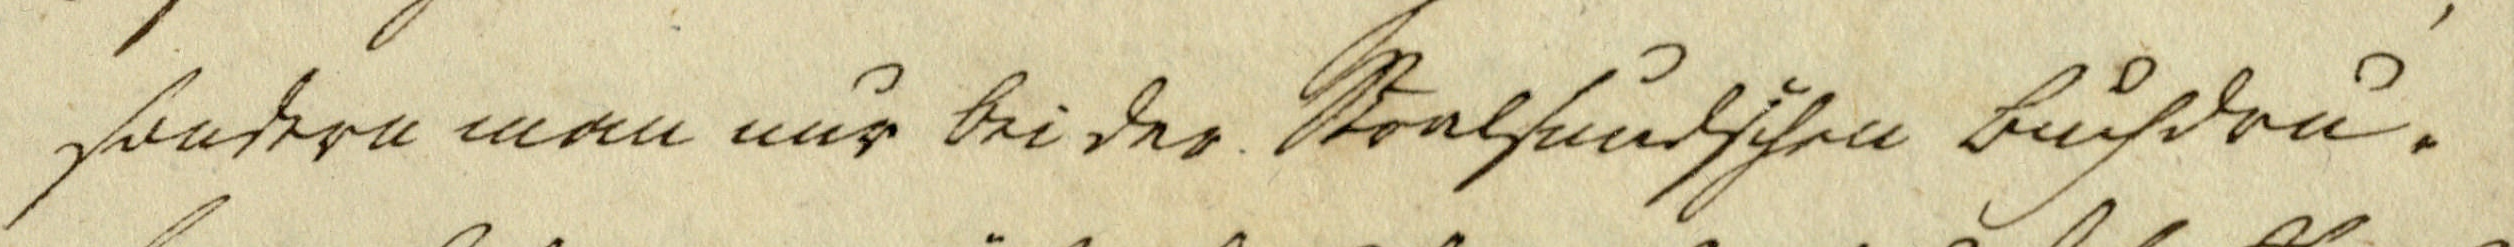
sondern man nur bei der Stralsundschen Buchdru¬
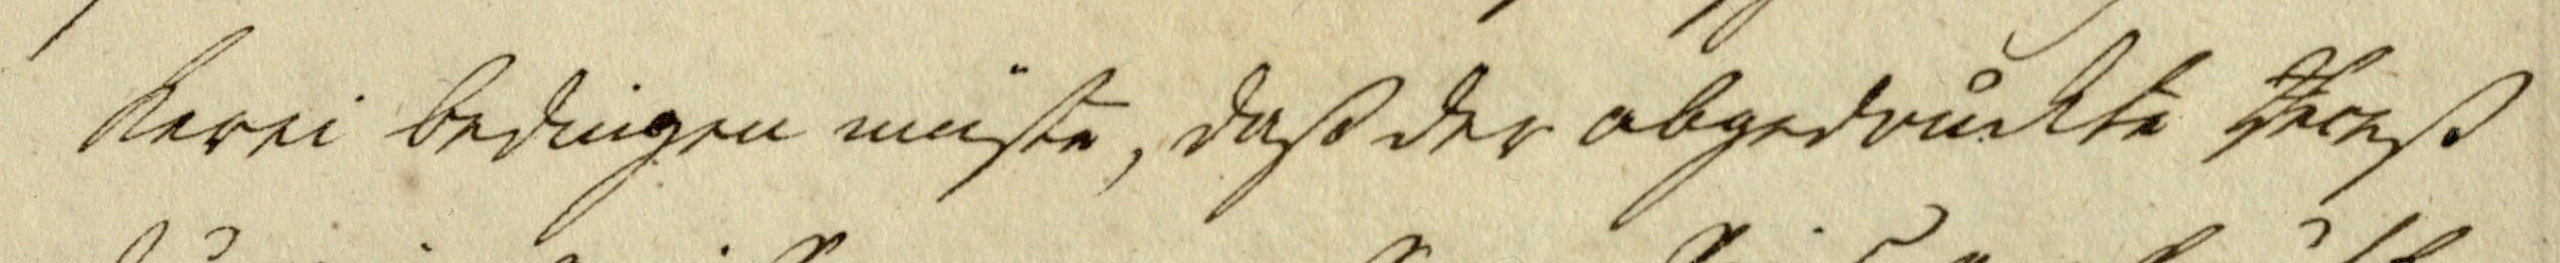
kerei bedingen müßte, daß der abgedruckte Receß
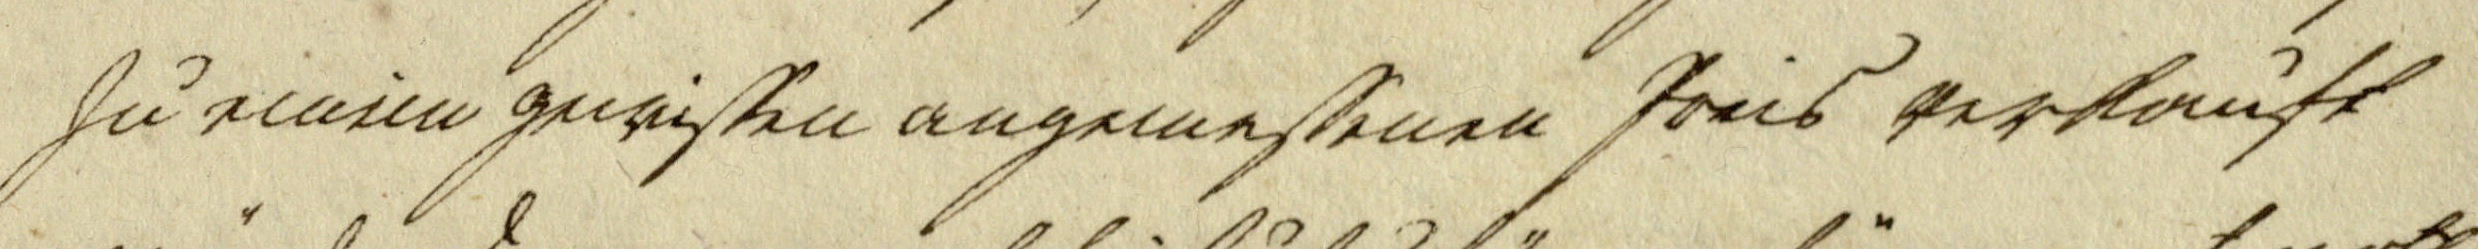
zu einem gewissen angemessenen Preis verkauft
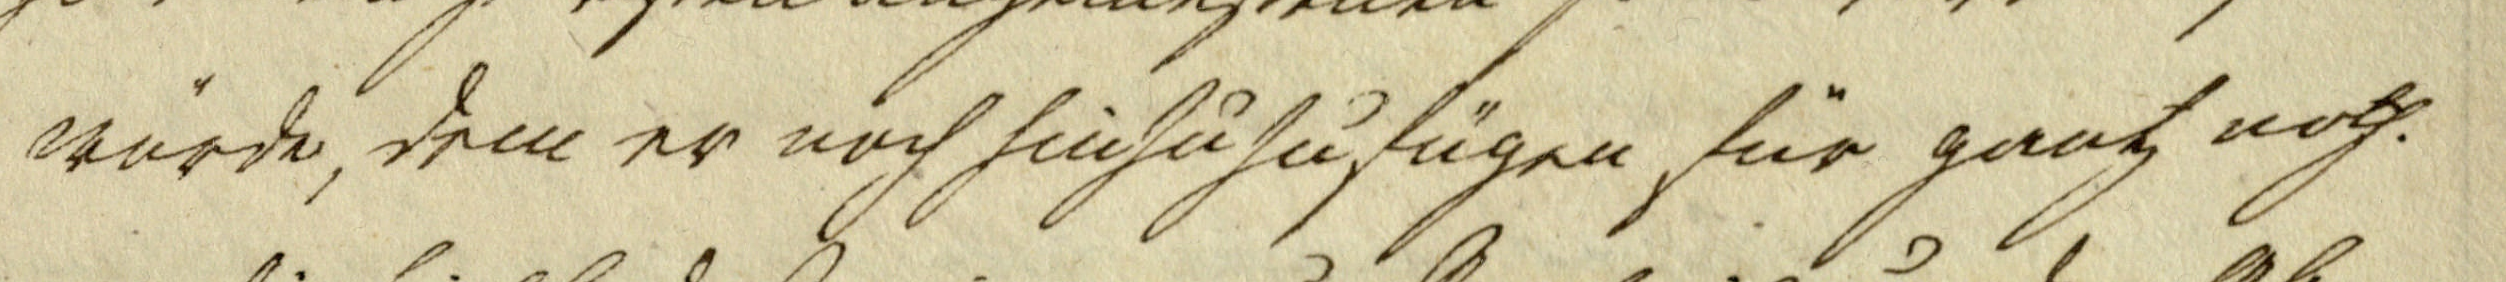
würde, dem er noch hinzuzufügen für gantz noth¬
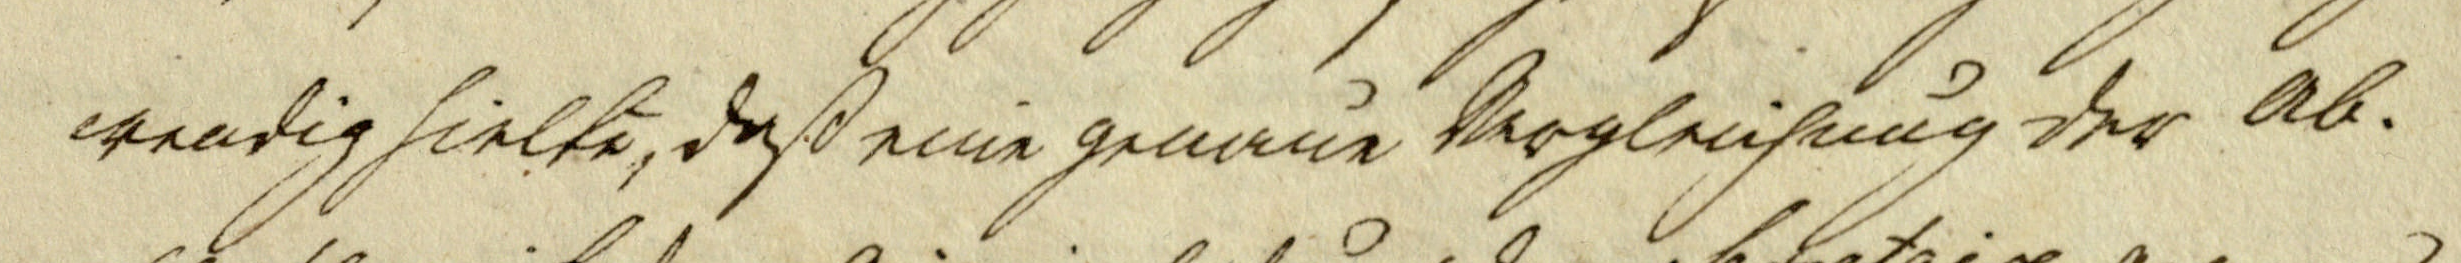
wendig hielte, daß eine genaue Vergleichung der Ab¬
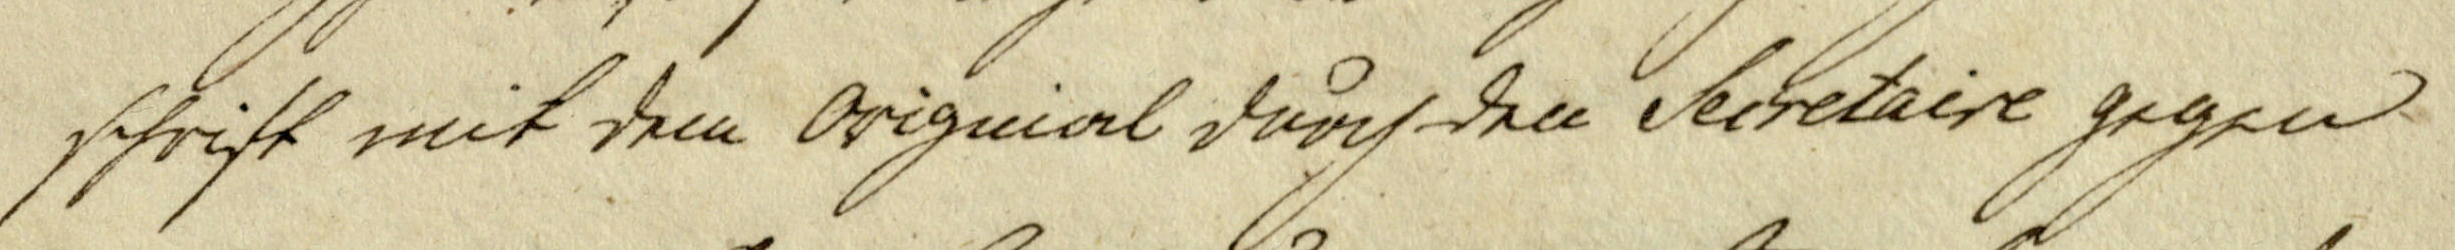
schrift mit dem Oripmal durch den Secretaire gegen
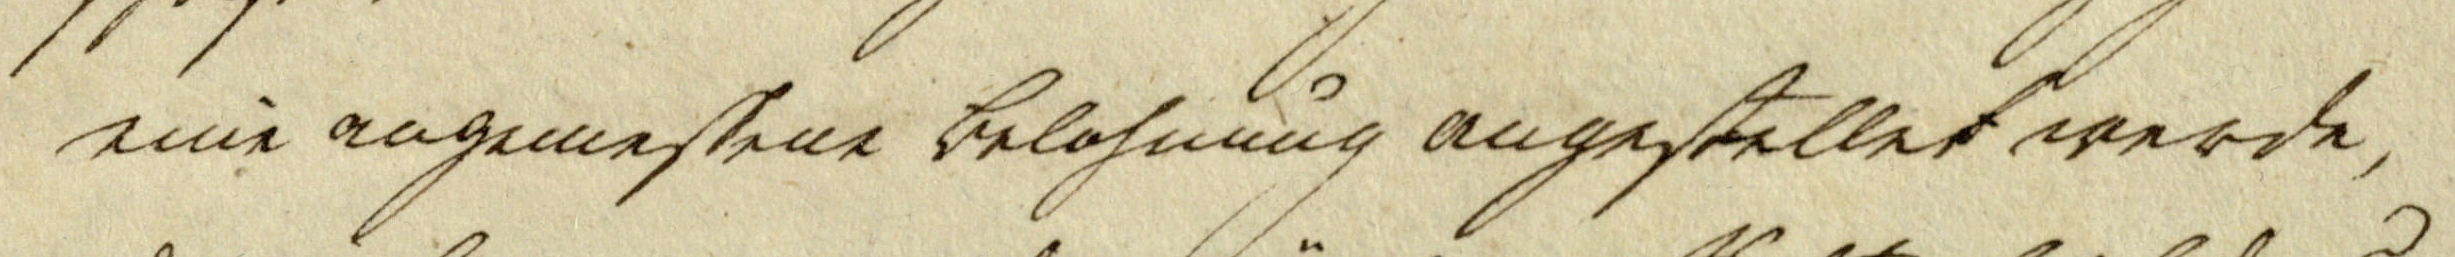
eine angemessene Belohnung angestellet werde,
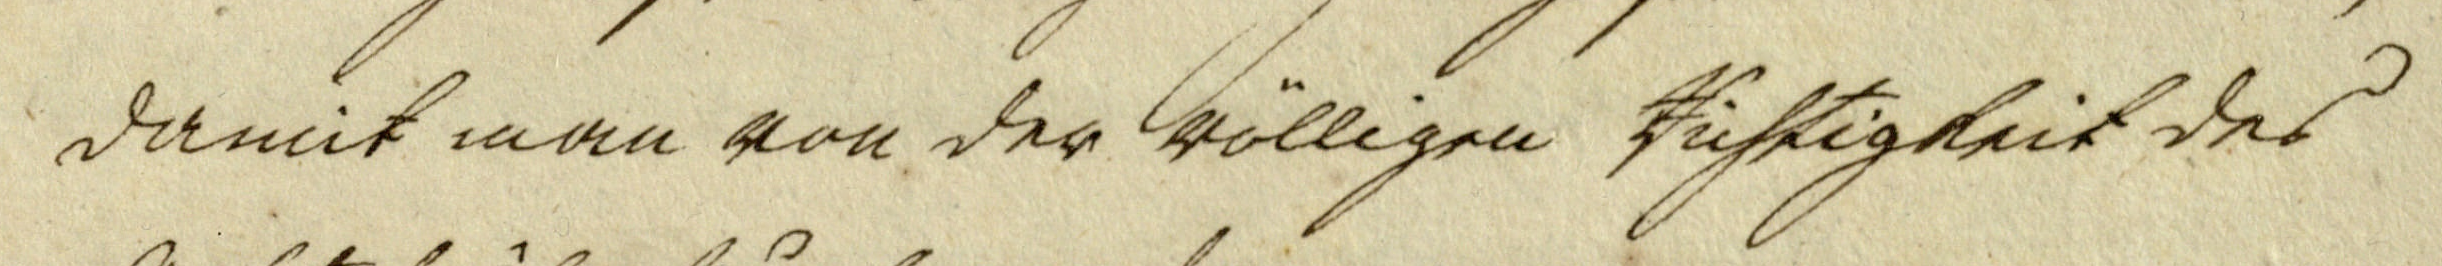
damit man von der völligen Richtigkeit des
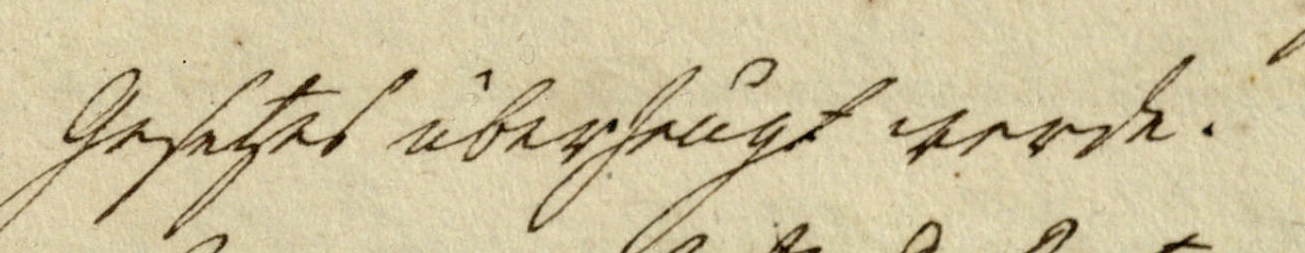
Gesetzes überzeugt werde.
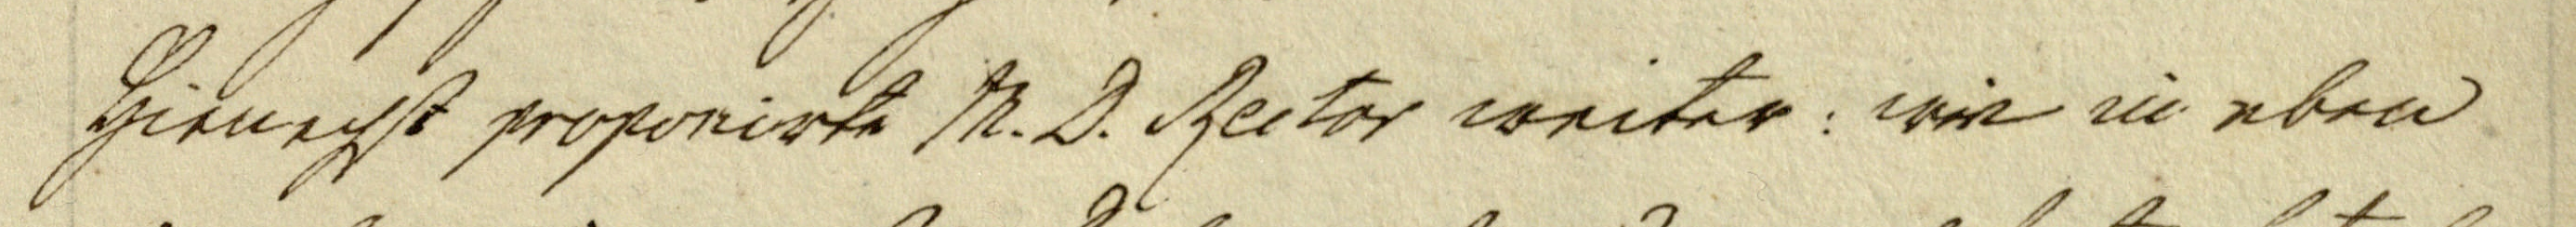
Hienechst proponirte M. D. Rector weiter: wie in eben
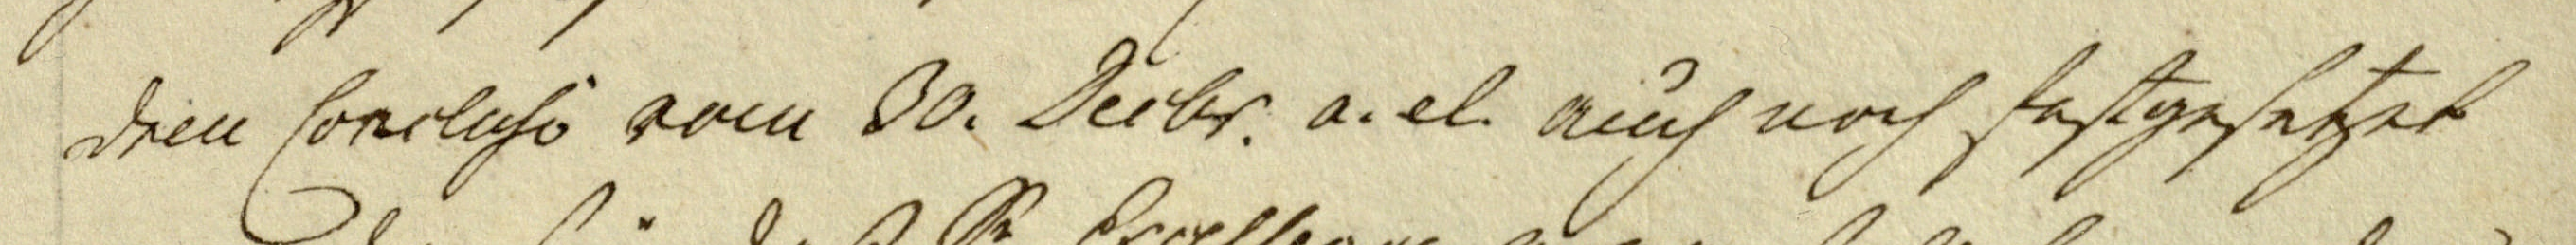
dem Concluso vom 30. Decbr. a. et. auch noch festgesetzet
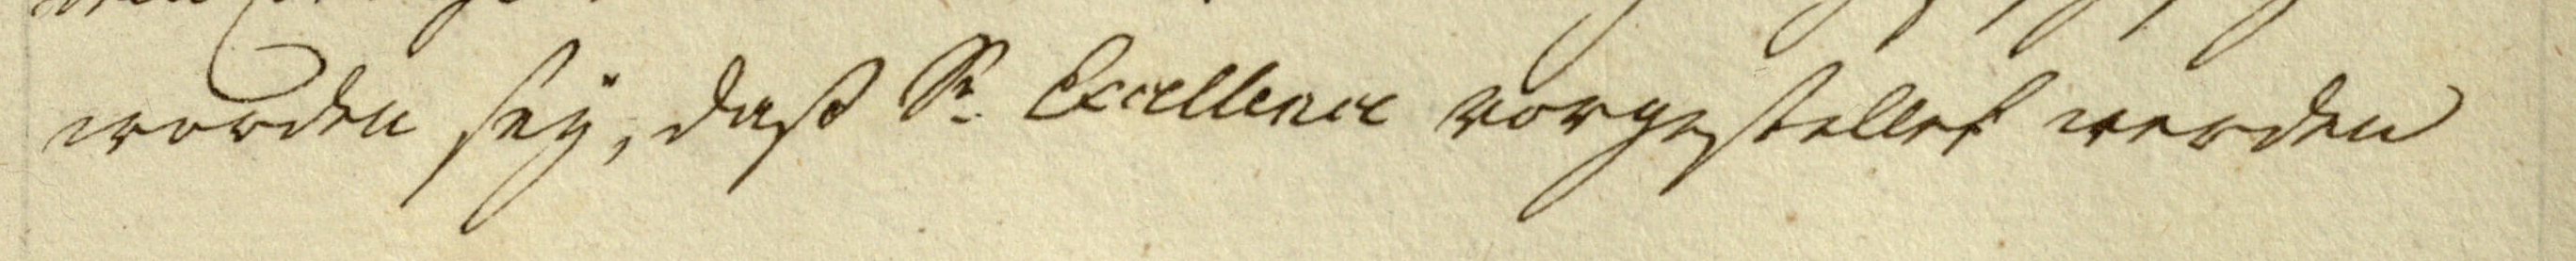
worden seÿ, daß Sr. Excellence vorgestellet werden
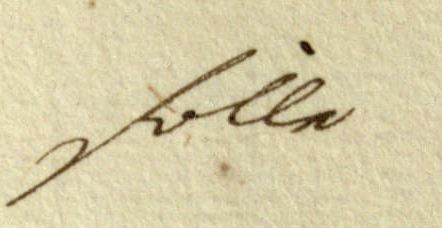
solle
